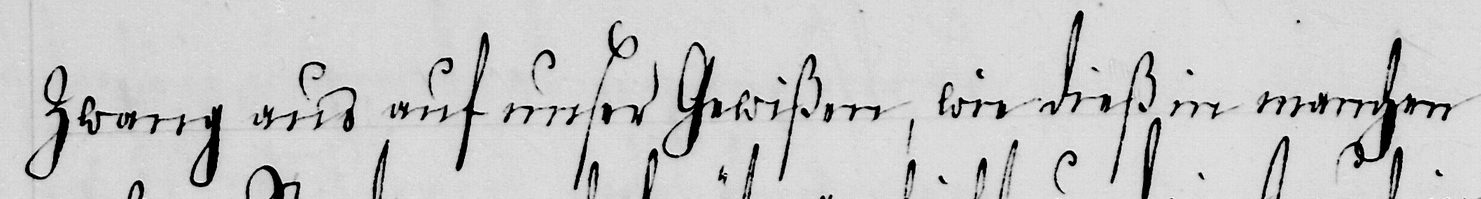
Zwang aus auf unser Gewißen, wie dieß in manchen
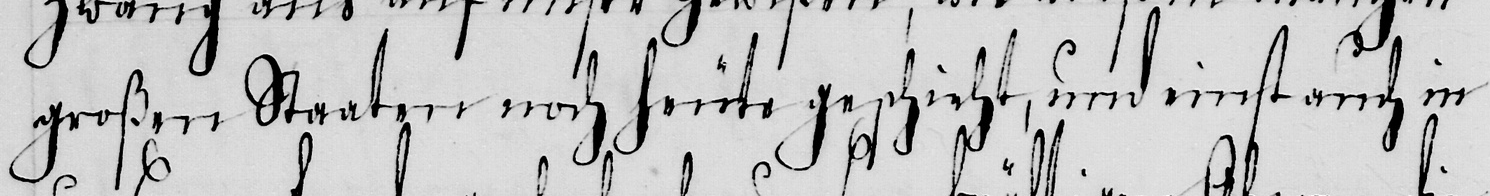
großen Staaten noch heute geschieht, und einst auch in
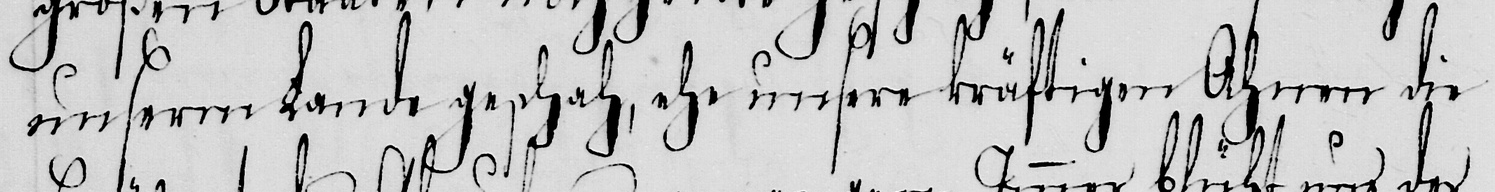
unserm Lande geschah, ehe unsere kräftigen Ahnen die
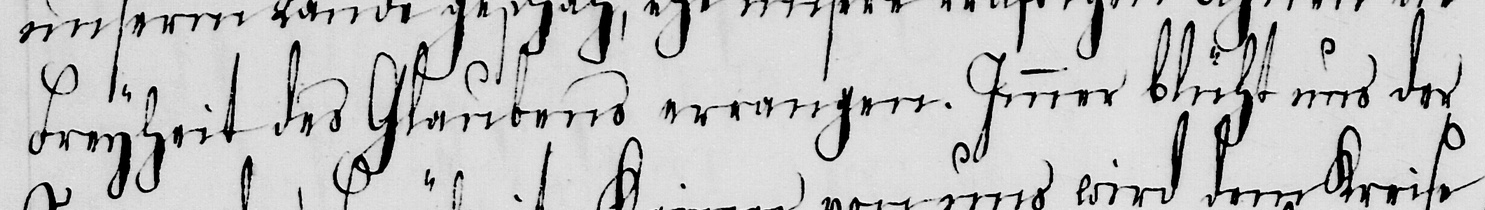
Freyheit des Glaubens errangen. Immer blüht uns der
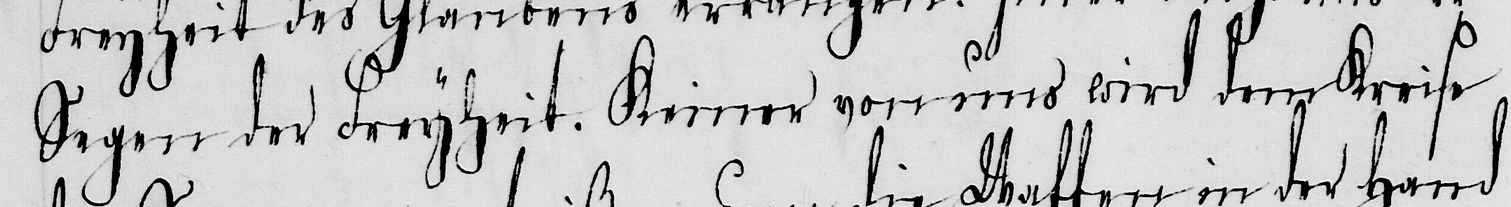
Segen der Freyheit. Keiner von uns wird dem Kreis
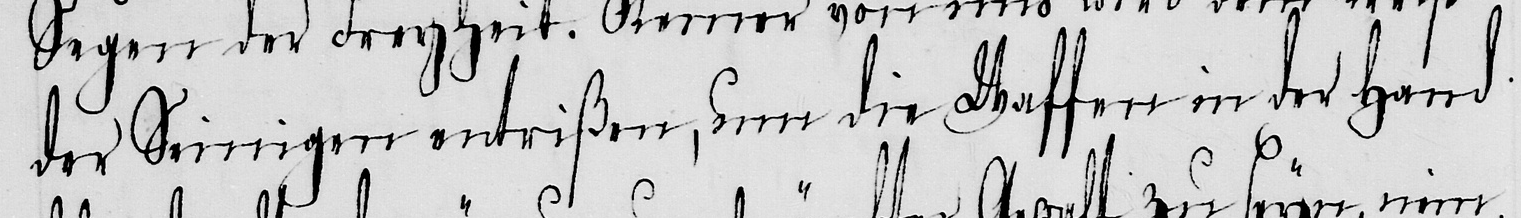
der Seinigen entrißen, um die Waffen in der Hand
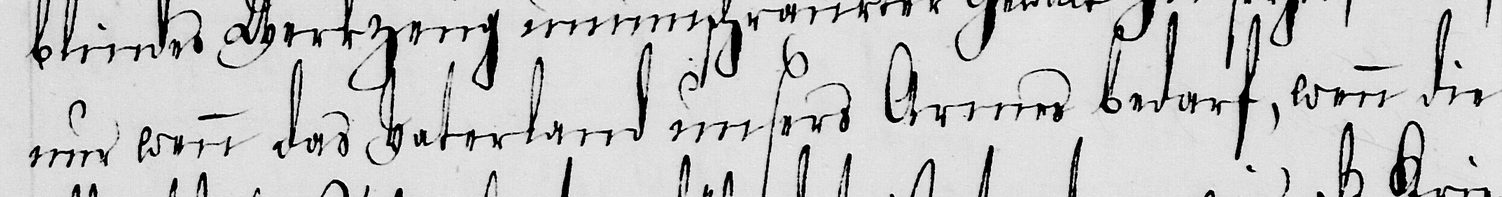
nur wenn das Vaterland unsers Armes bedarf, wenn die
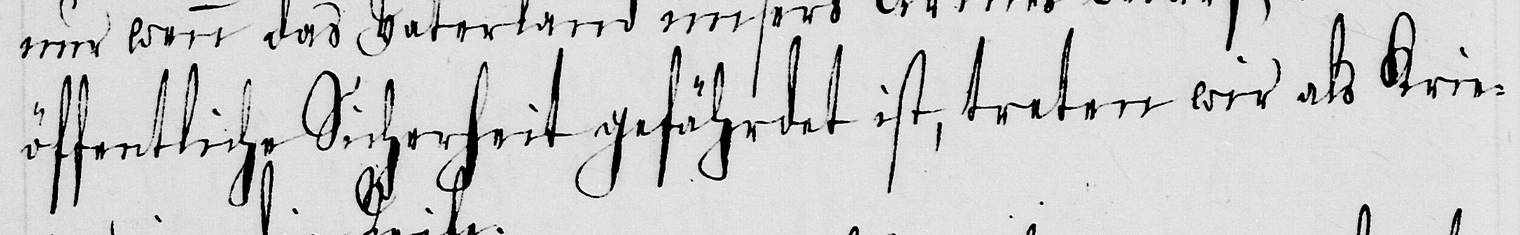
ffentliche Sicherheit gefährdet ist, treten wir als Krie¬
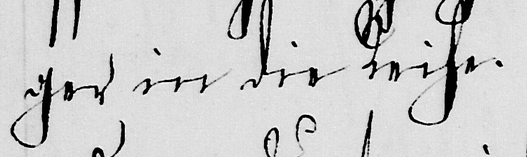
ger in die Reihe.
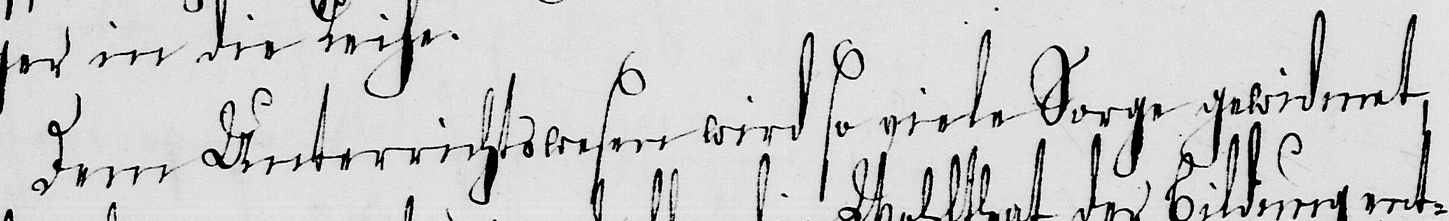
Dem Unterrichtswesen wird so viele Sorge gewidmet,
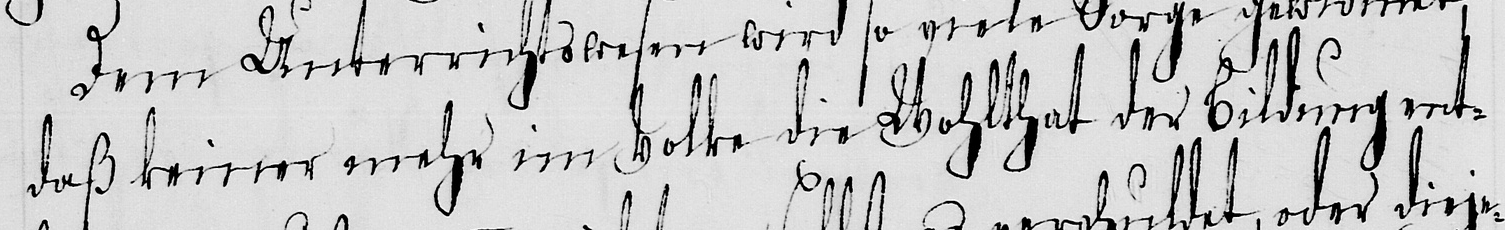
daß keiner mehr im Volke die Wohlthat der Bildung ent¬
